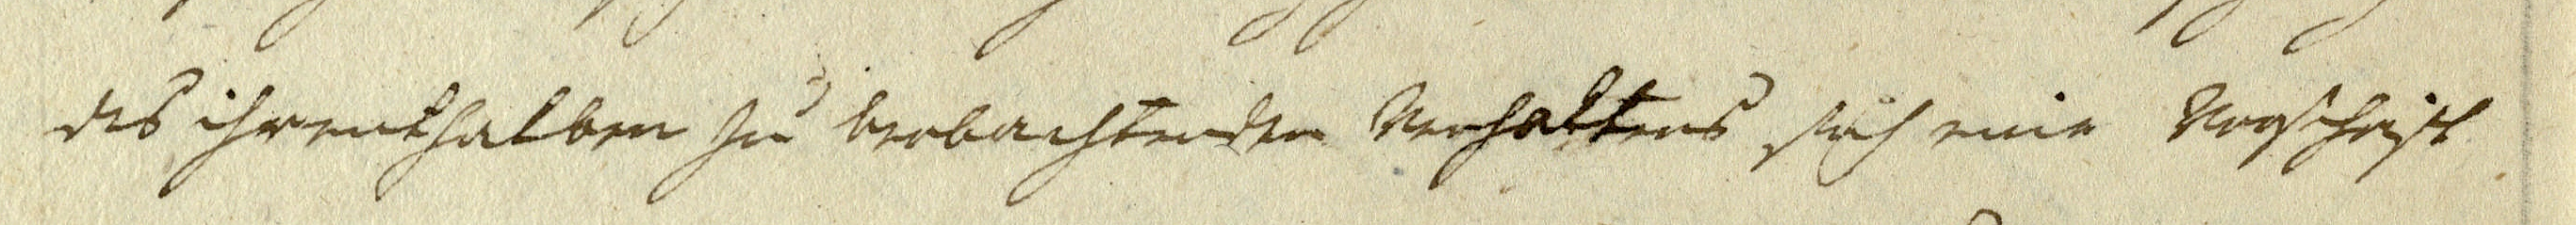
des ihrenthalben zu beobachtenden Verhaltens sich eine Vorschrift
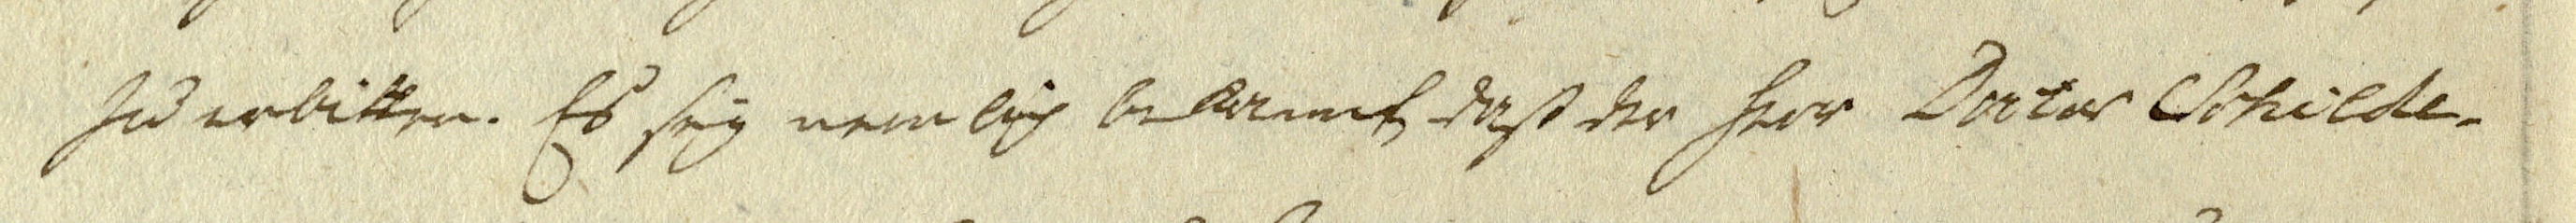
zu erbitten. Es seÿ nemlich bekannt, daß der Herr Doctor Schilde¬
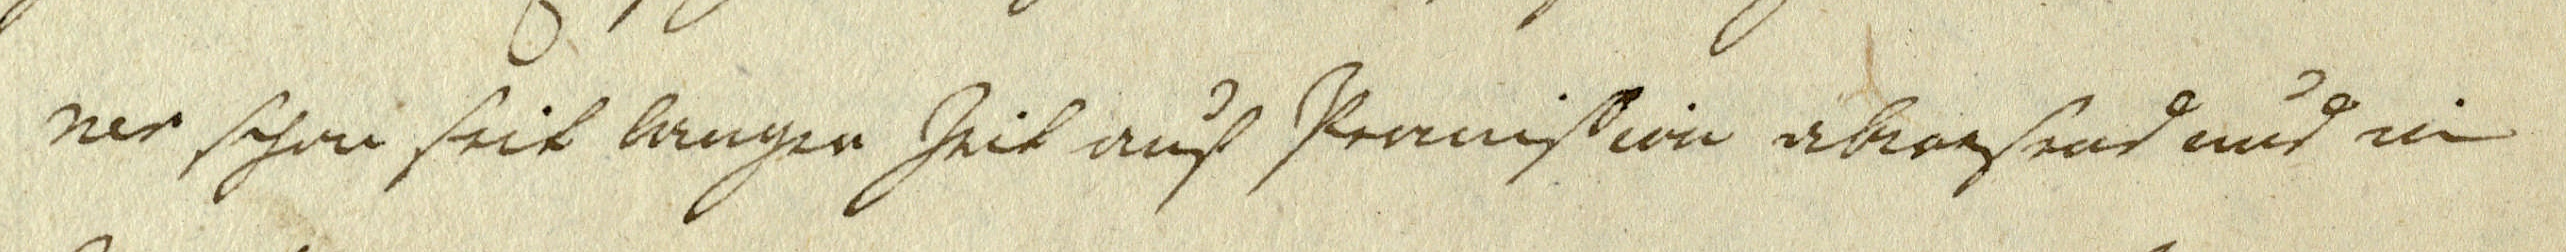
ner schon seit langer Zeit auf Permission abwesend und in
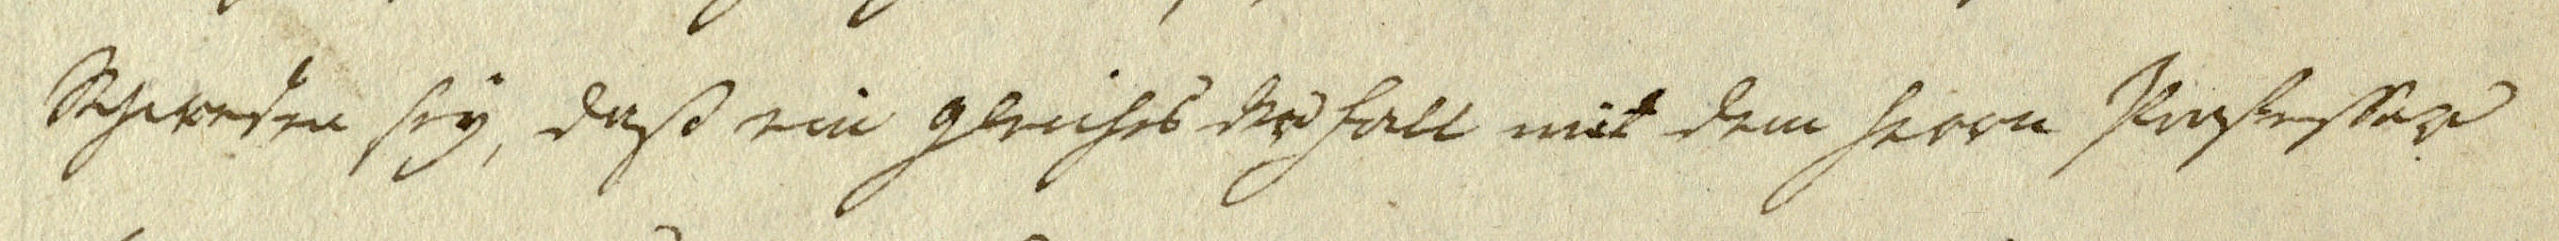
Schweden seÿ, daß ein gleiches der Fall mit dem Herrn Professor
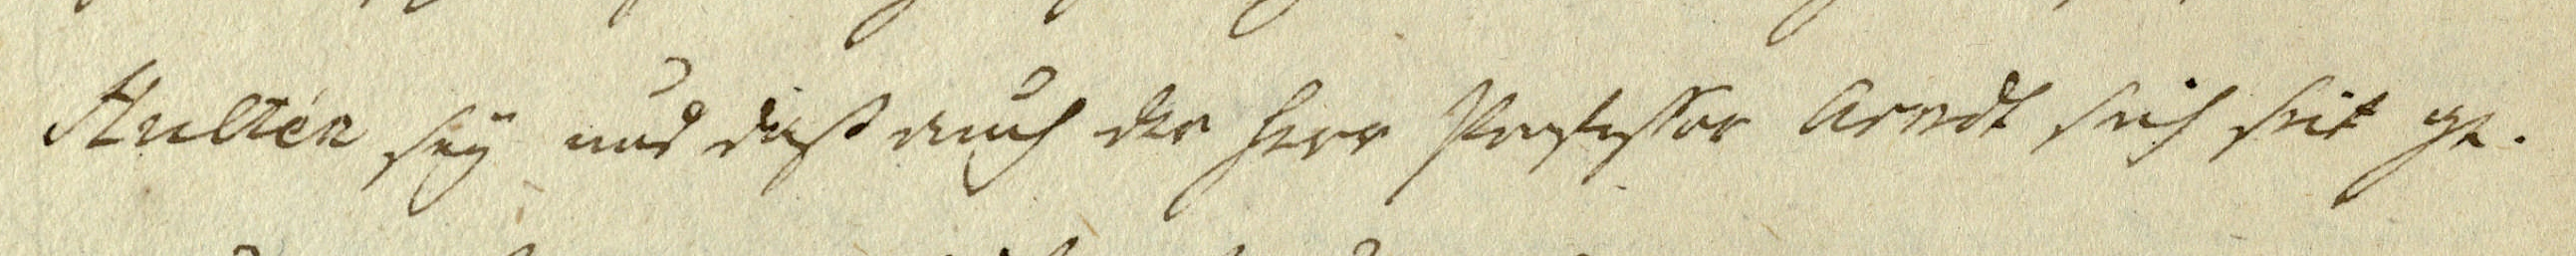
Hultén seÿ und daß auch der Herr Professor Arndt sich seit ge¬
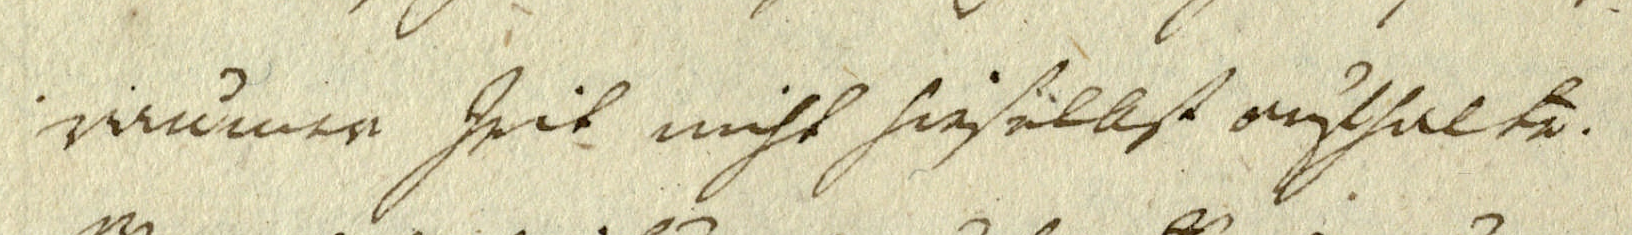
raumer Zeit nicht hieselbst aufhalte.
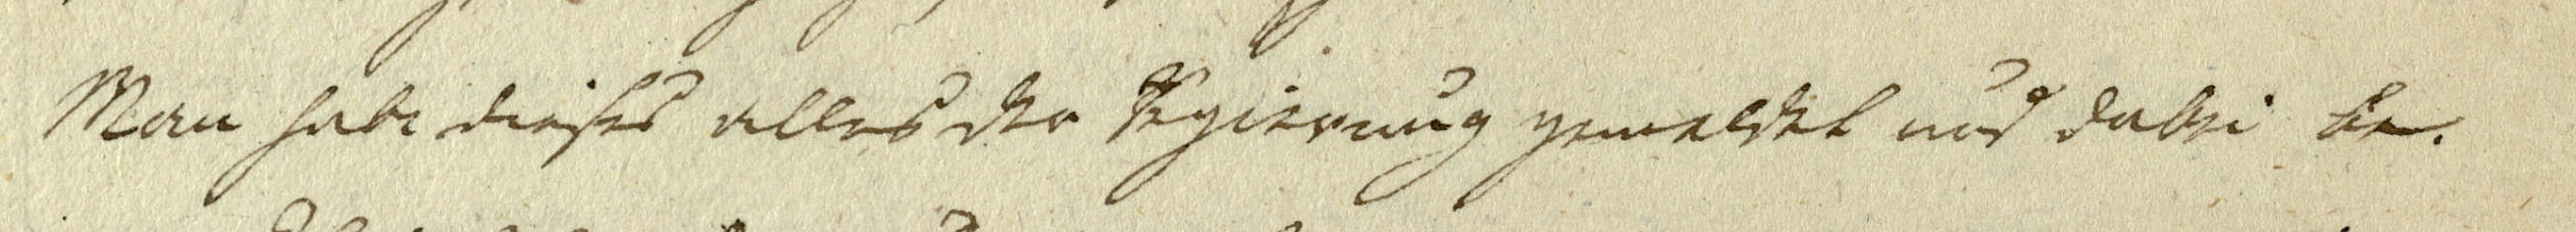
Man habe dieses alles der Regierung gemeldet und dabei be¬
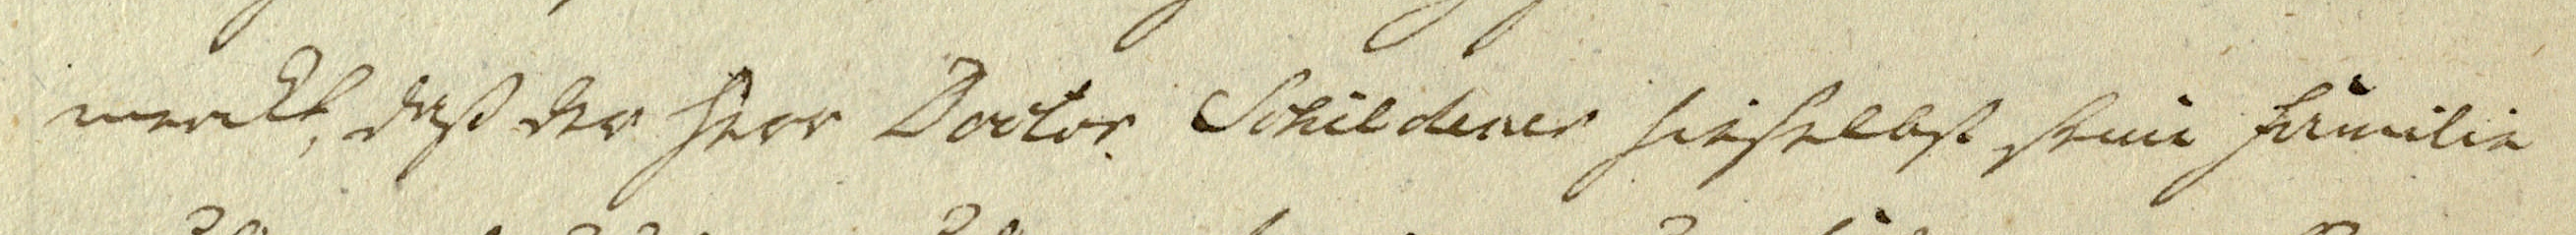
merckt, daß der Herr Doctor Schildener hieselbst seine Familie
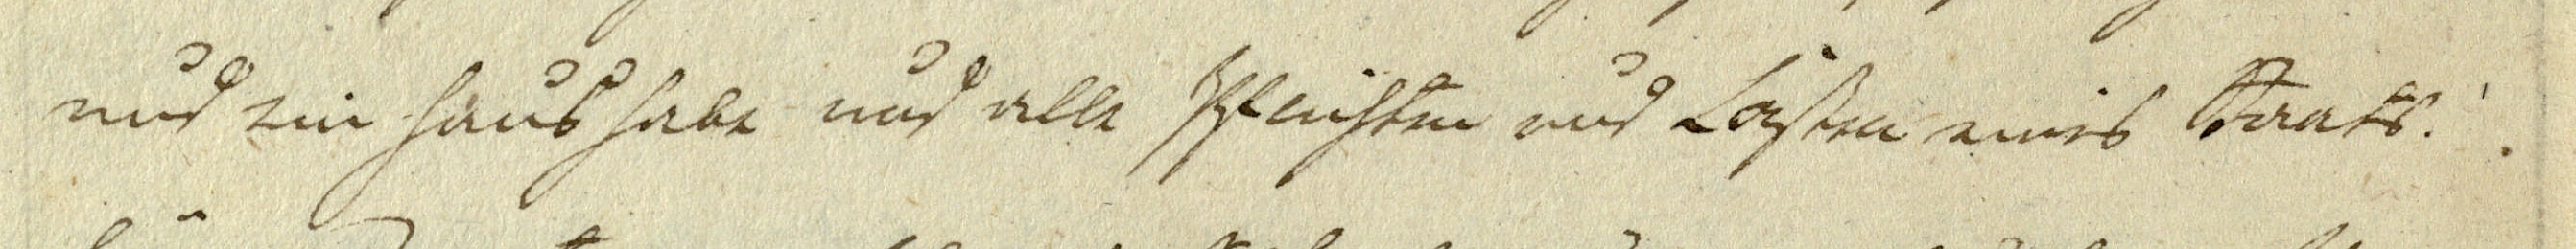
und ein Haus habe und alle Pflichten und Lasten eines Staats¬
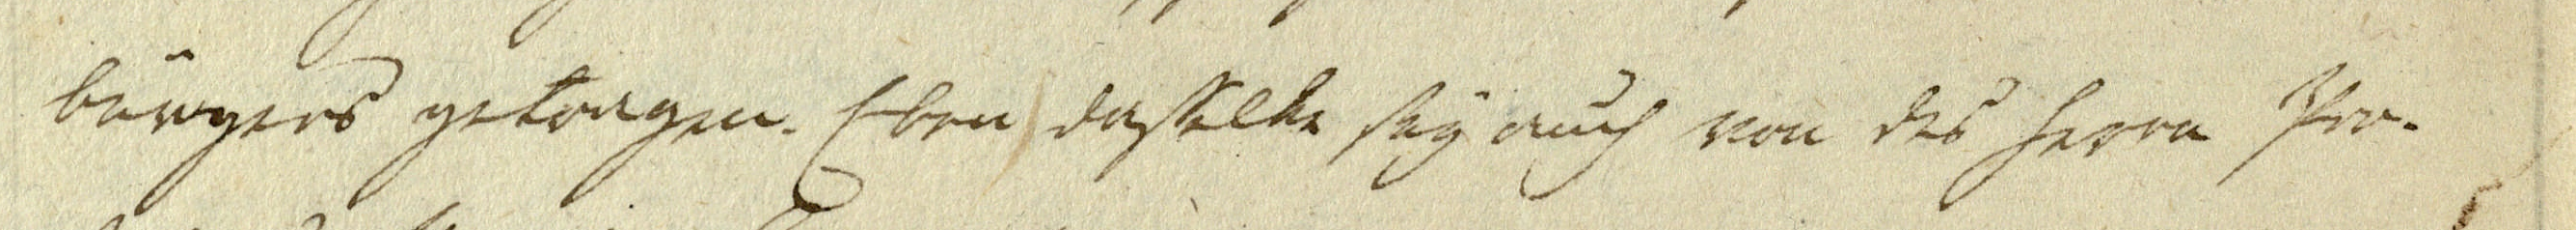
bürgers getragen. Eben dasselbe seÿ auch von des Herrn Prof¬
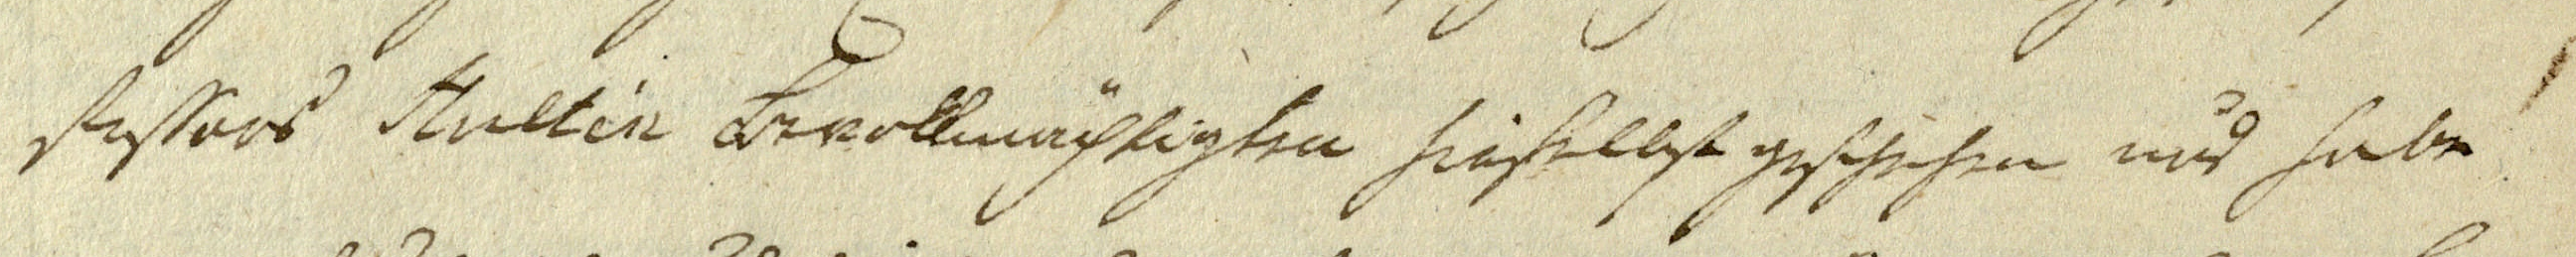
fessors Hultén Bevollmächtigten hieselbst geschehen und habe
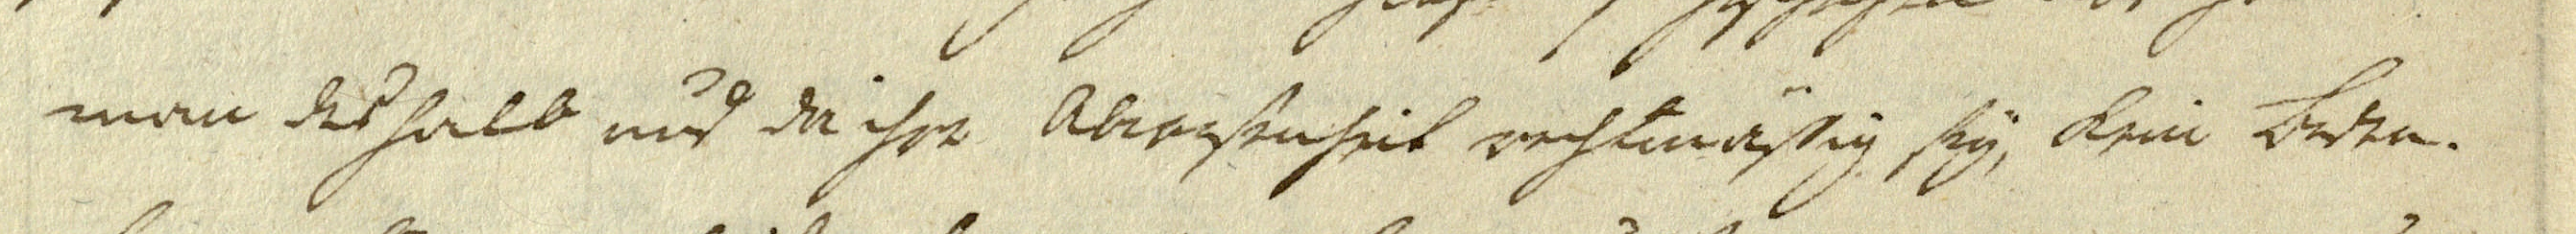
man deshalb und da ihre Abwesenheit rechtmässig seÿ, kein Beden¬
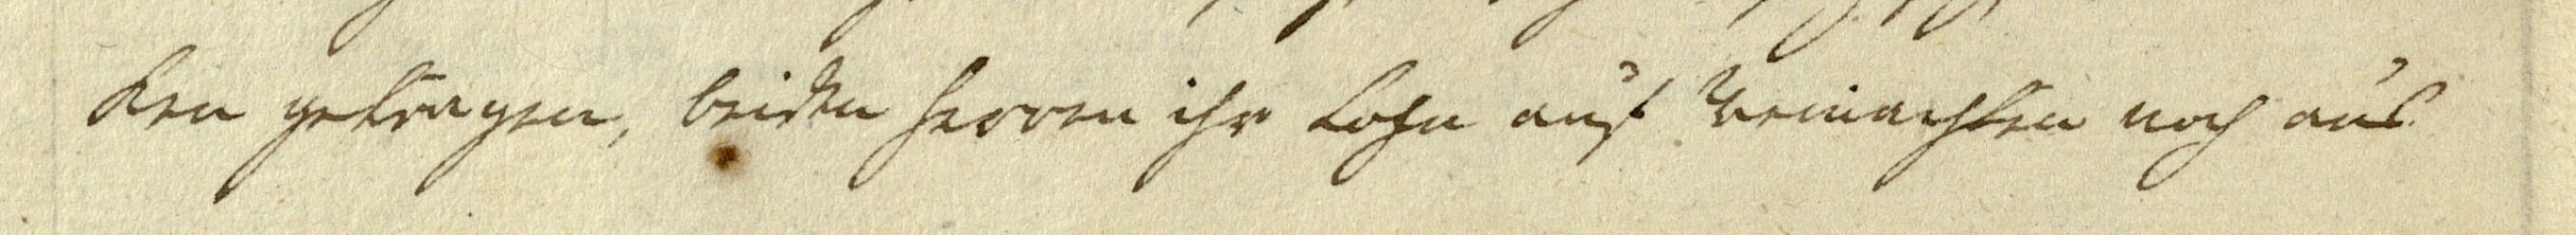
ken getragen, beiden Herren ihr Lohn auf Weinachten noch aus¬
